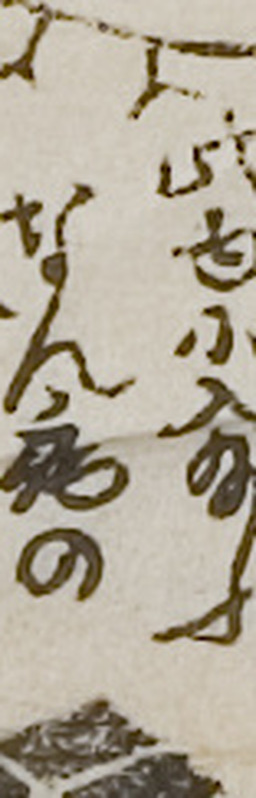なん病の
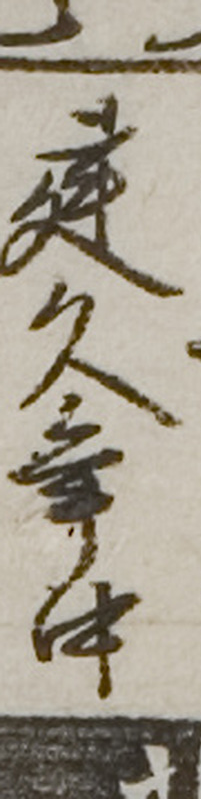建久年中
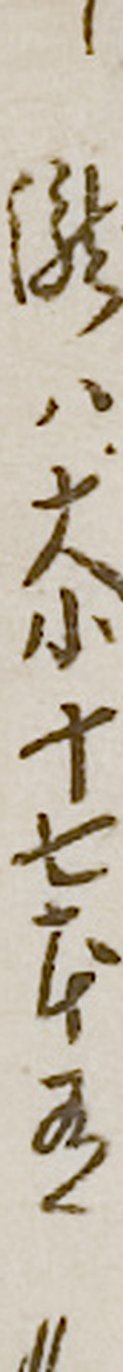滝は大小十七本有
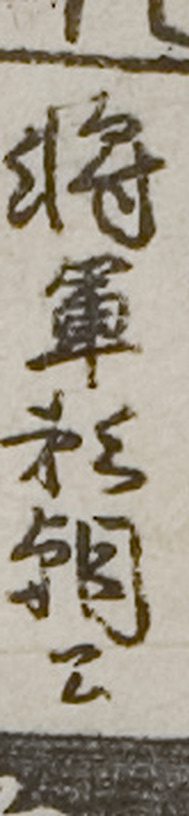将軍頼朝公
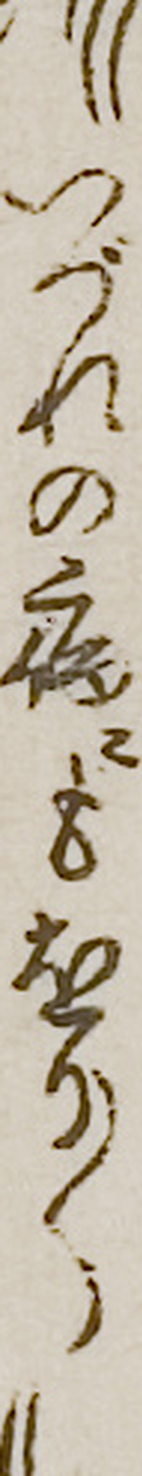いづれの病にもをり〳〵
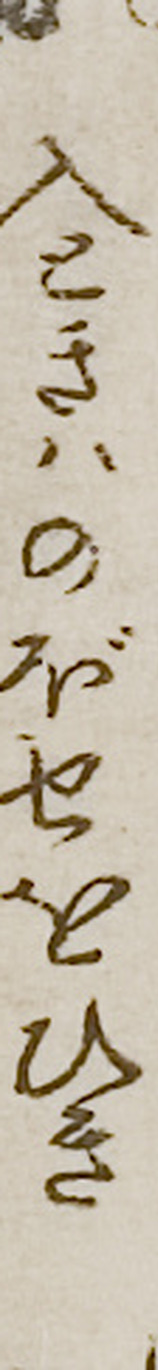入ときはのぼせをひき
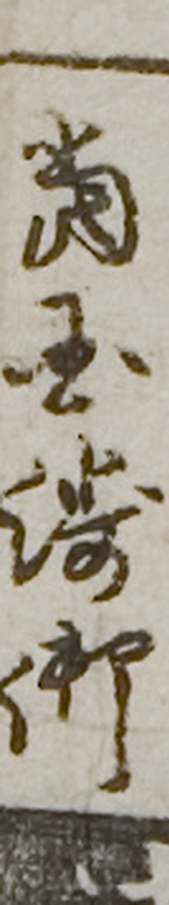当国崎御
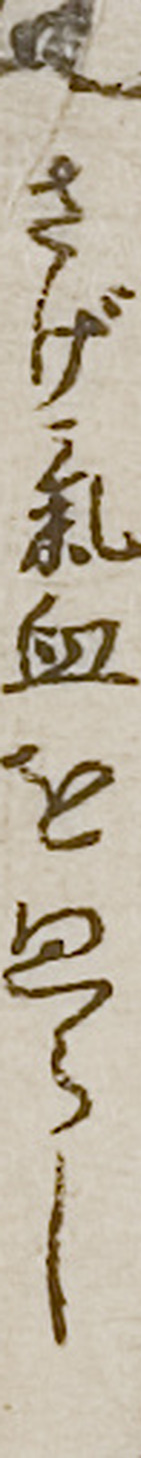さげ気血を廻らし
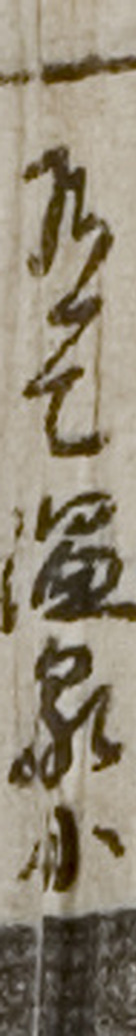道て温泉に
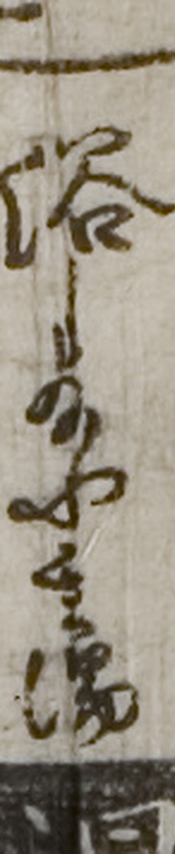浴し給ふ其湯
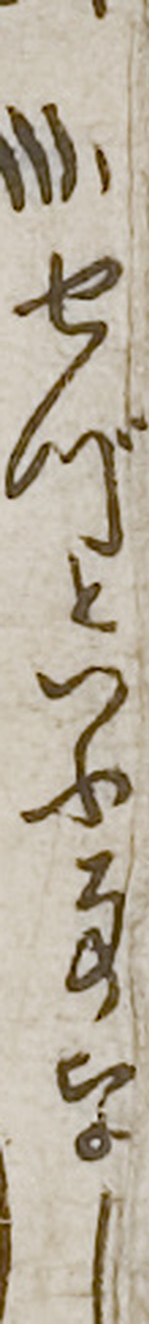せづという事なし
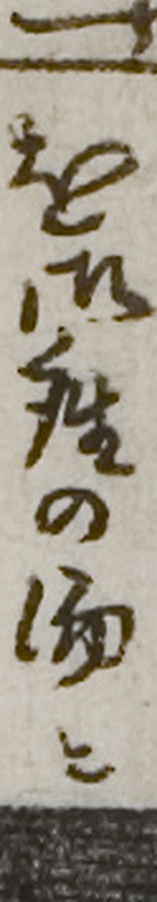を御座の湯と
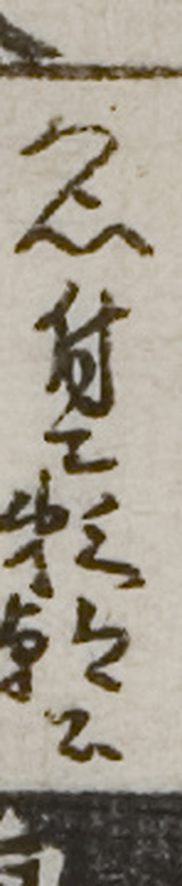名付に頼朝公
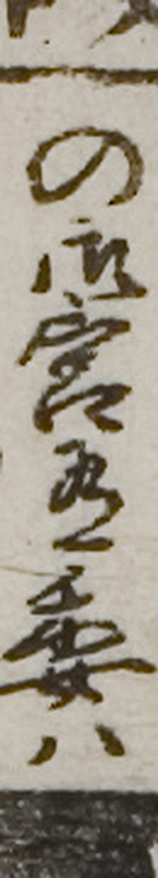の御宮有委は
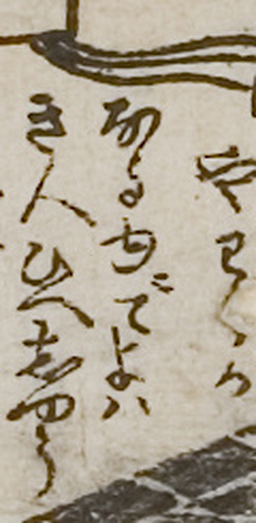なるゆにてよは
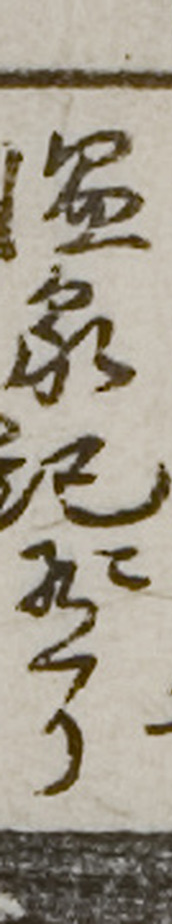温泉記に有
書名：上州草津温泉大図
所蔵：東京大学総合図書館 General Library in the University of Tokyo, JAPAN
